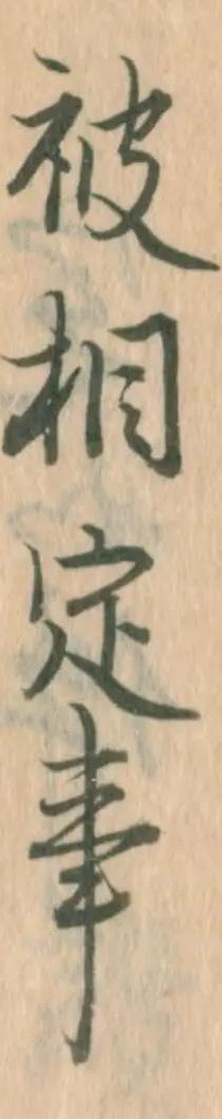被相定事
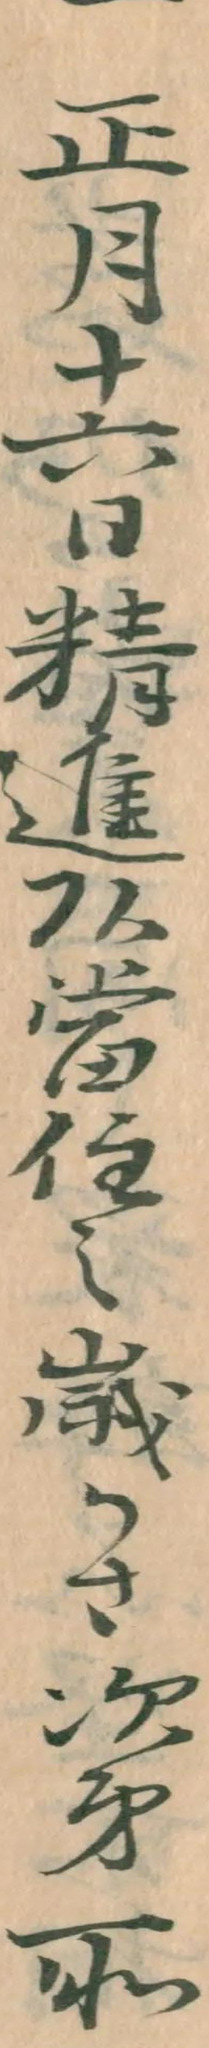一、正月十六日精進頭当住之歳かさ次第所
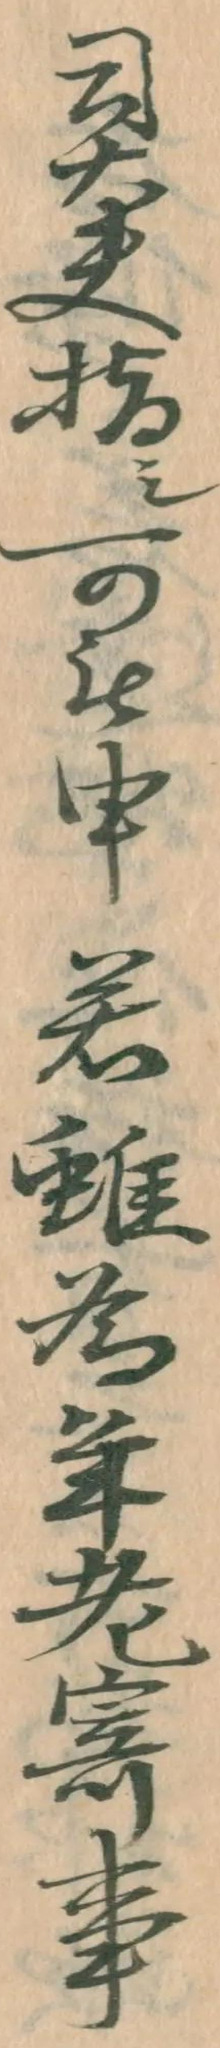司大夫指シ可被申若雖為年老寄事
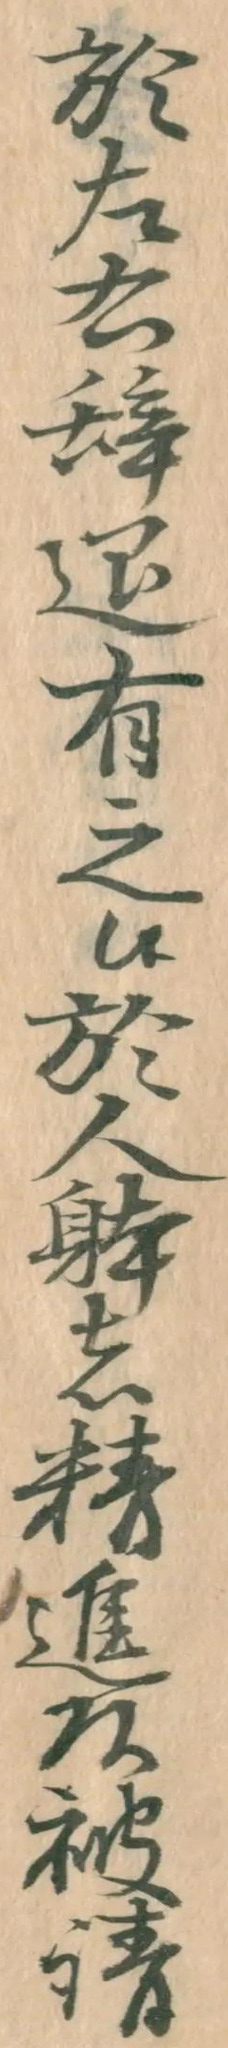於左右辞退有之候於人躰は精進頭被請
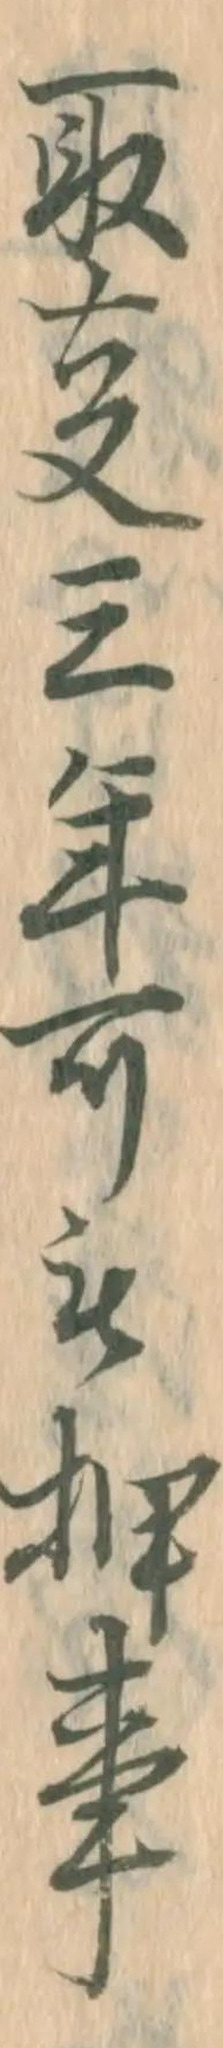取事三年可被押事
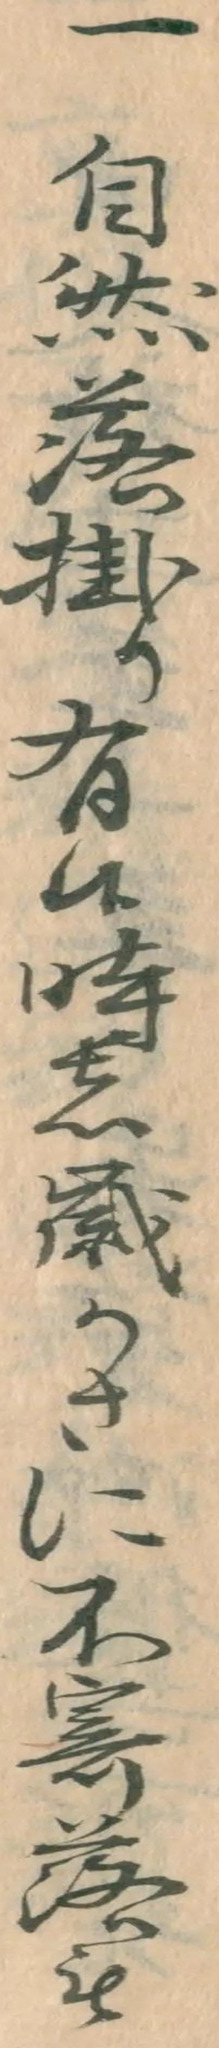一、自然落掛り有候時者歳かさに不寄落も

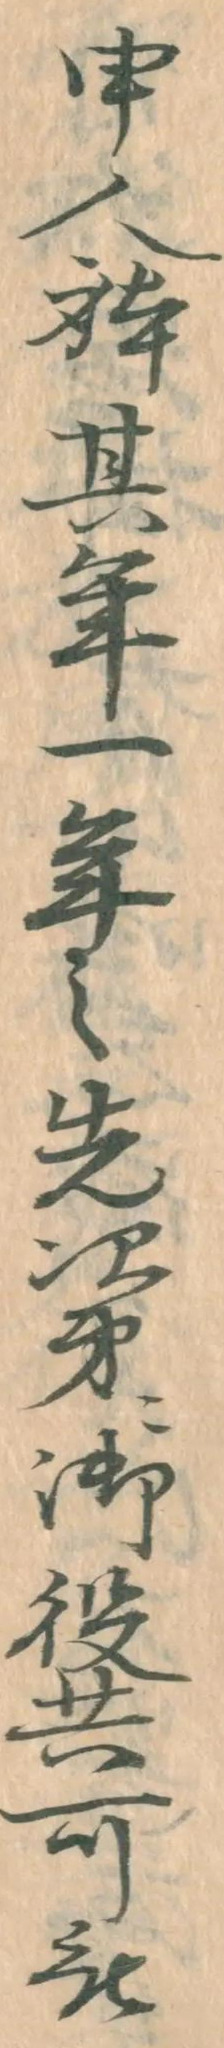申人躰其年一年之先次第ニ御役共可被
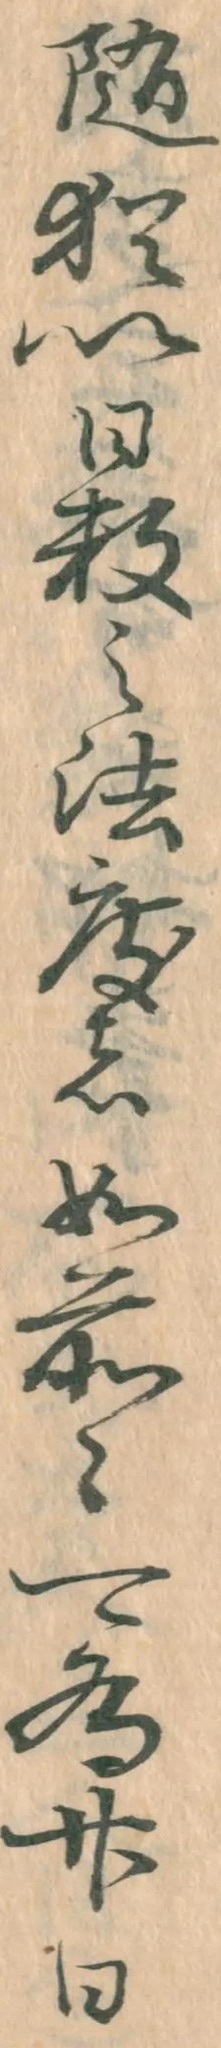随猶以日数之法度者如前々可為廿日
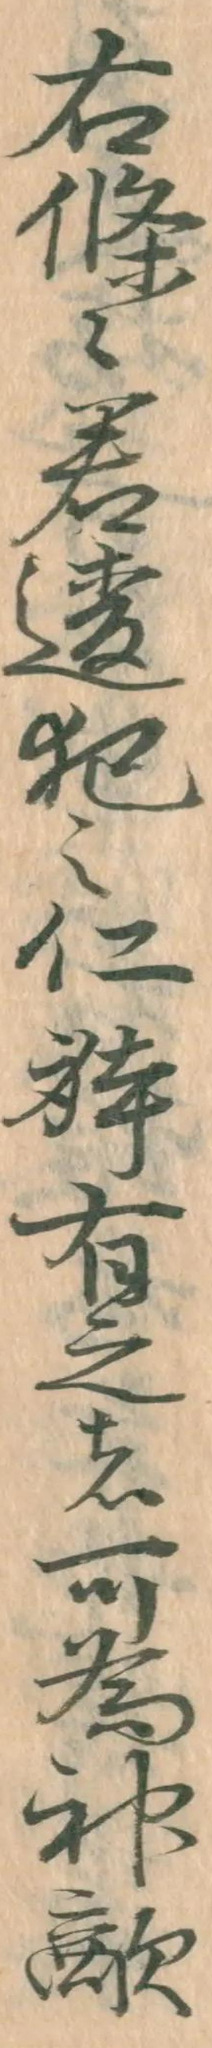右條々若違犯之仁躰有之者可為神敵
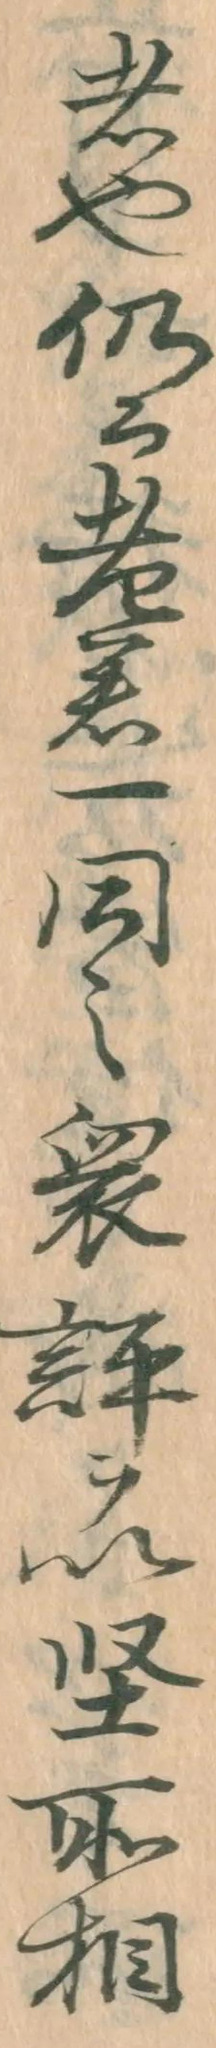者也仍て老若一同之衆評ヲ以堅所相
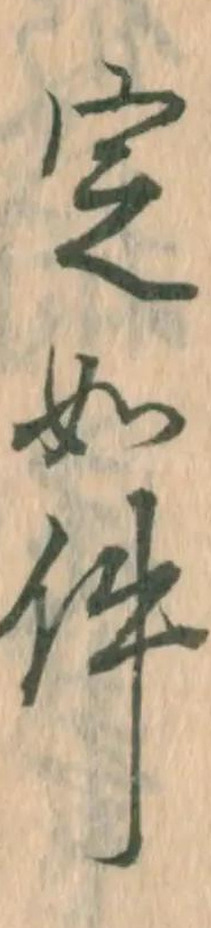定如件
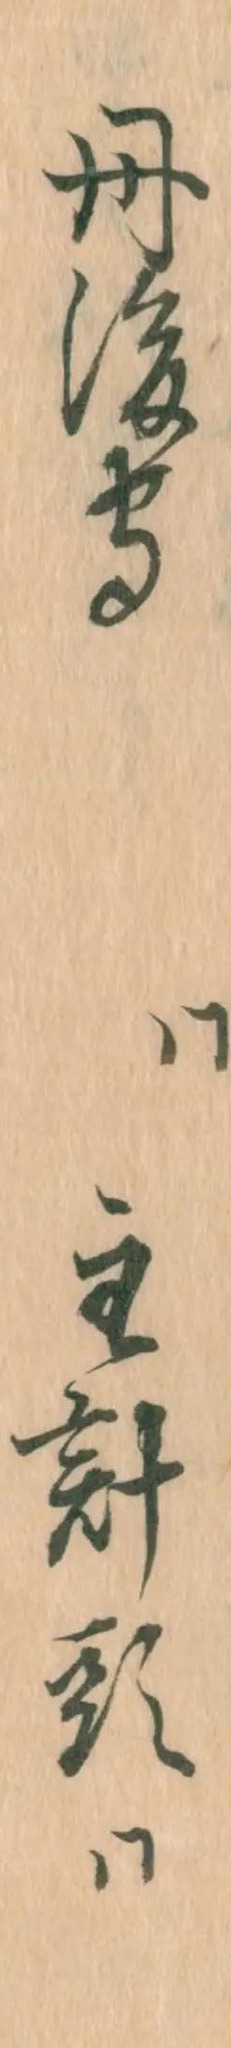丹後守同主計頭同
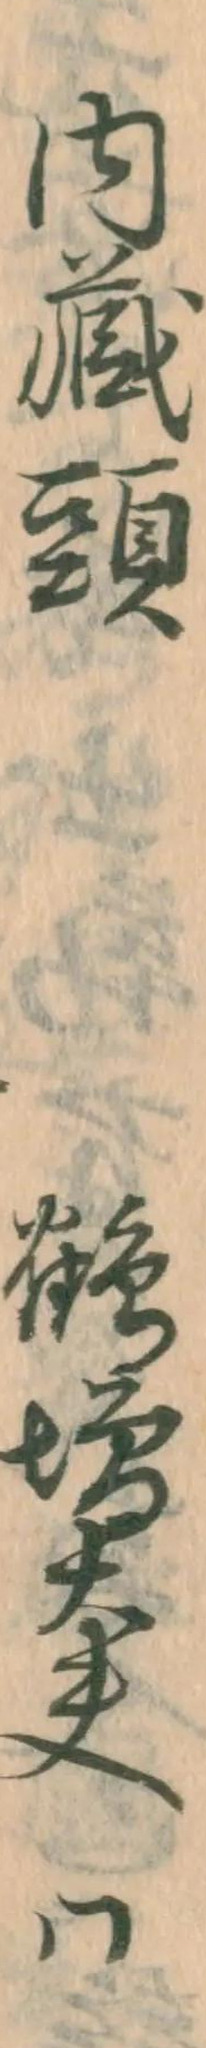内蔵頭鶴増大夫同
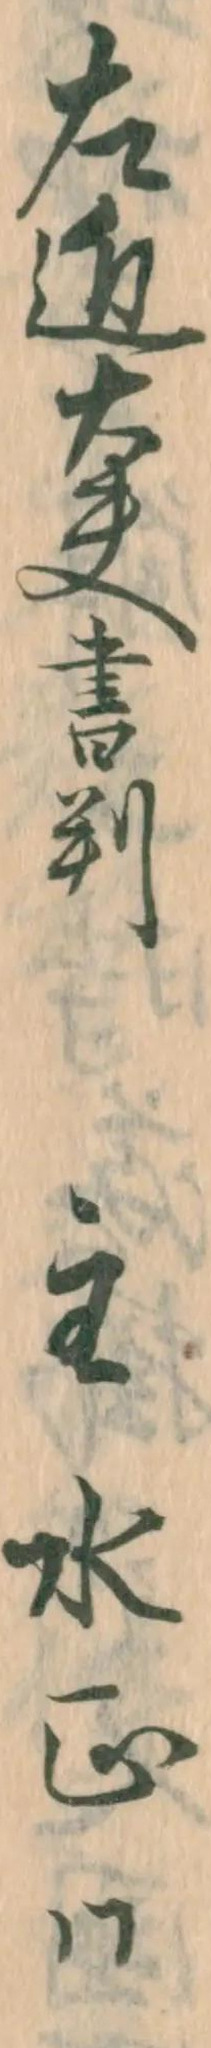左近大夫書判主水正同
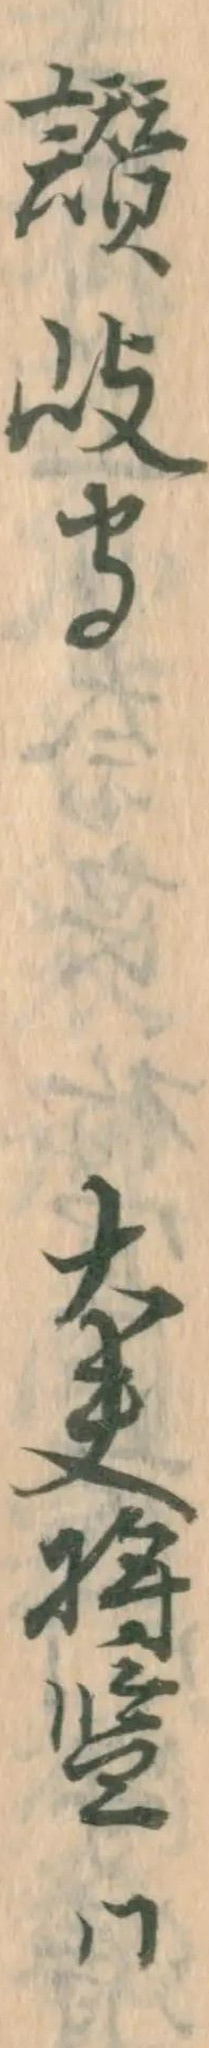讃岐守大夫将監同
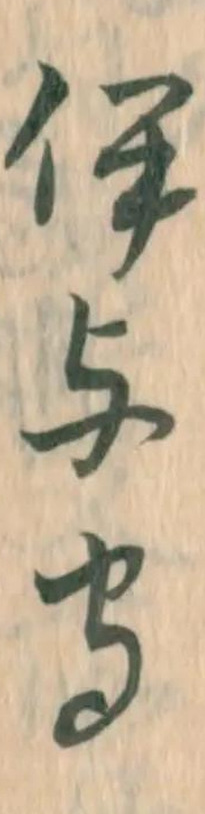伊予守
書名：賀茂社記録. 第39冊
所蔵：国立国会図書館 National Diet Library, JAPAN
